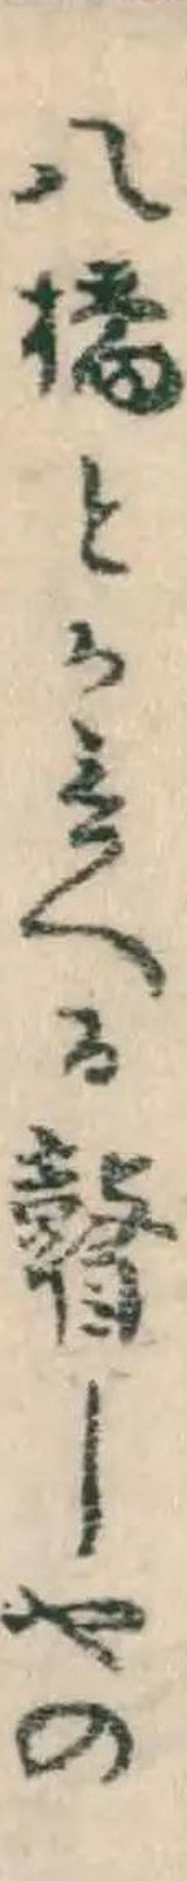八橋とか言へる瞽しやの
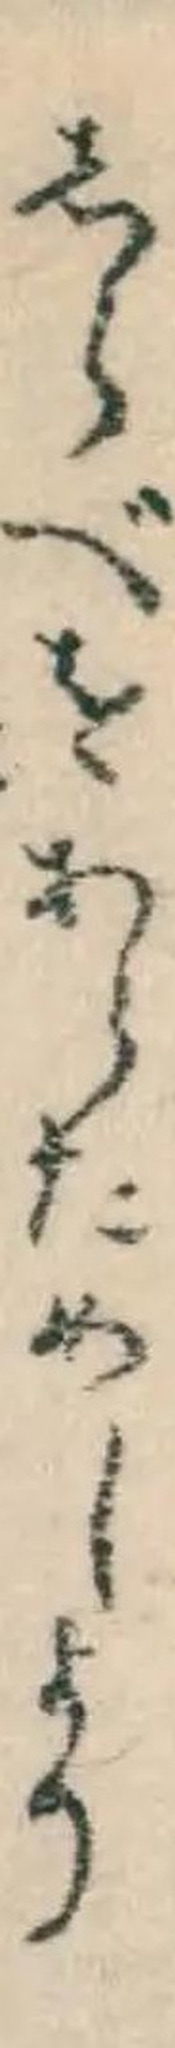しらべをあらためしより
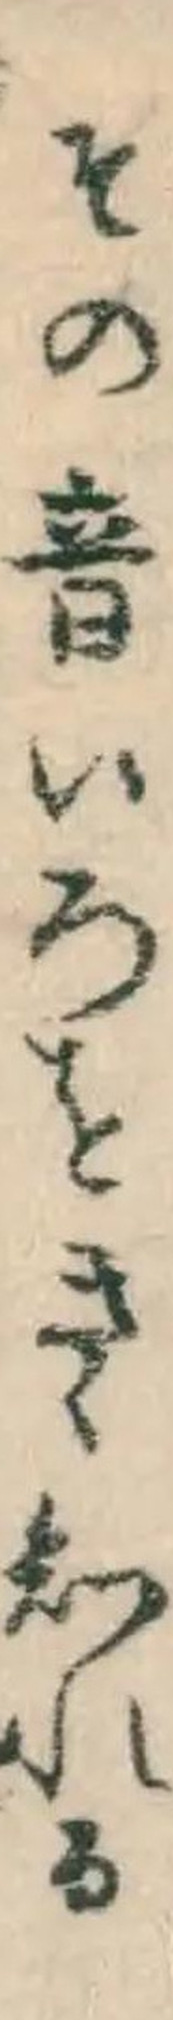その音いろをきゝ知れる
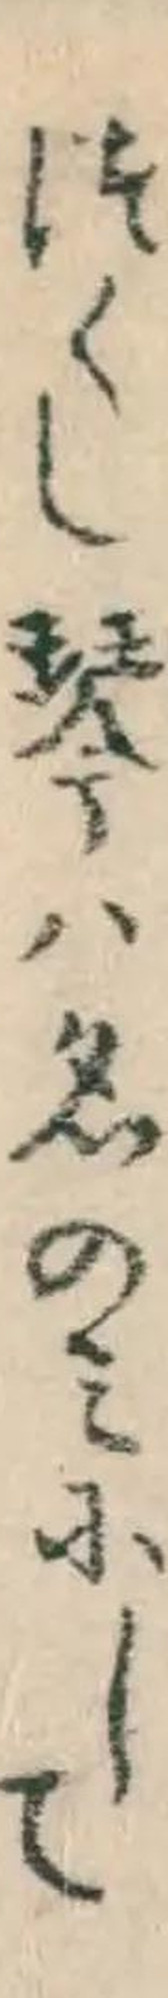つくし琴は名のみにして
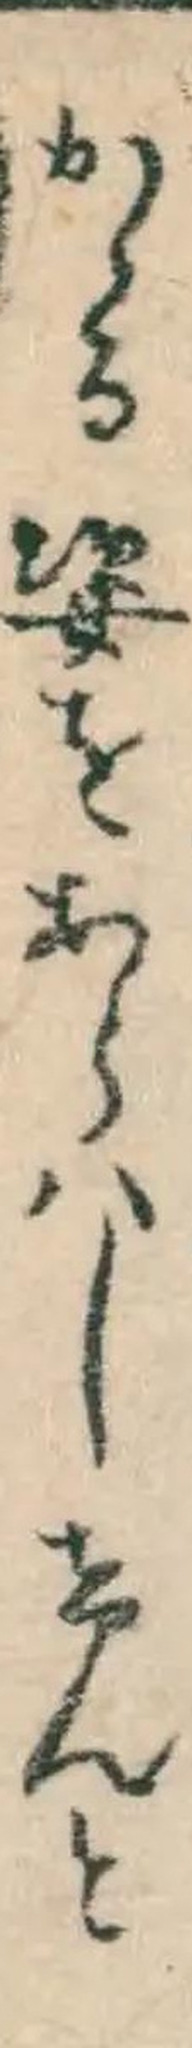かゝる姿をあらはしけんと
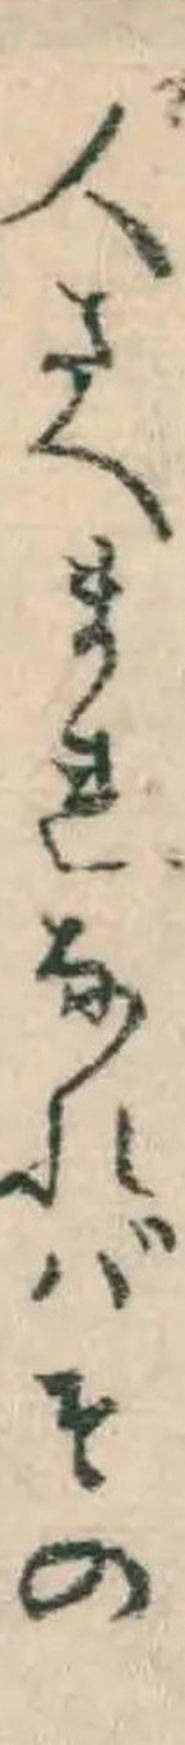人さへまれなればその
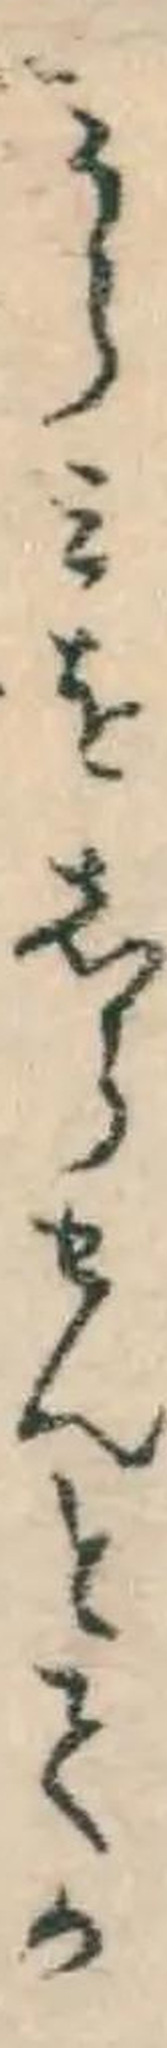うらみをしらせんとてか
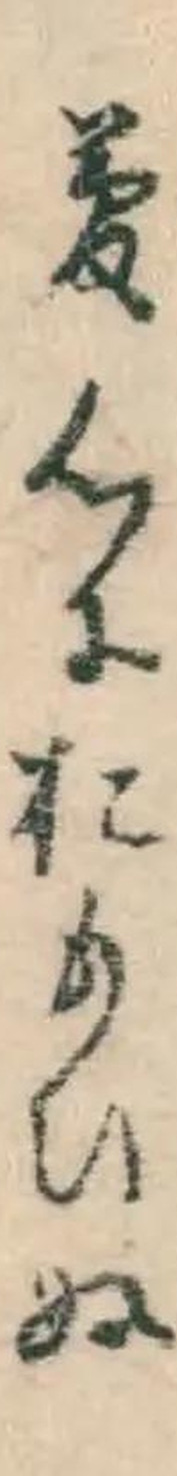夢心におもひぬ
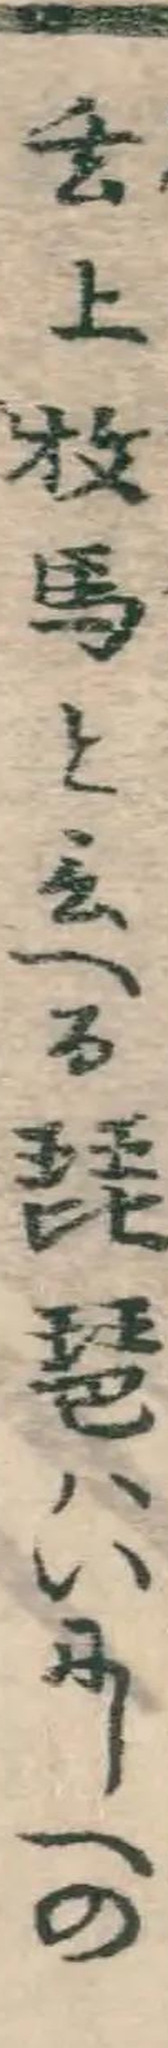玄上牧馬と云へる琵琶はいにしへの
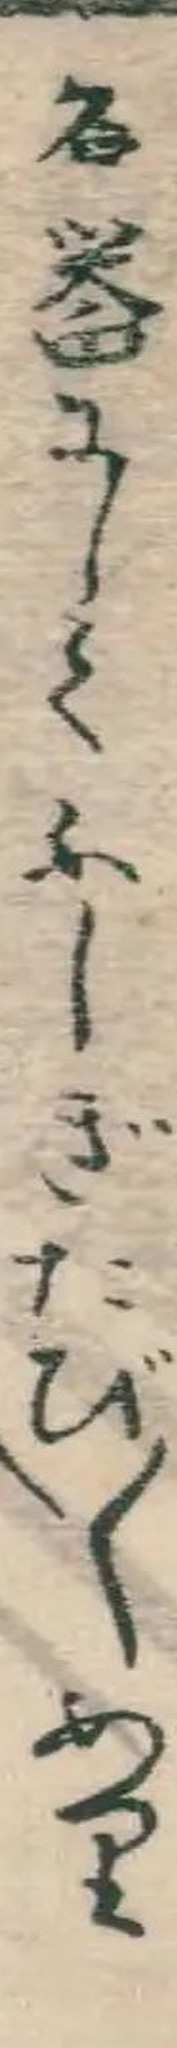名誉にしてふしぎたび〳〵あり
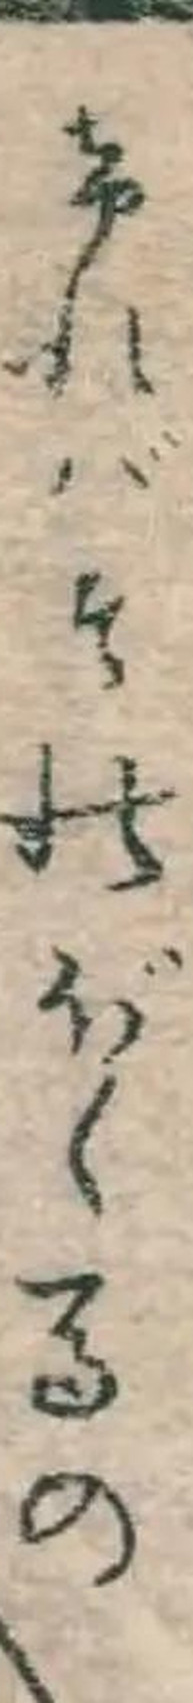ければそのぼく馬の
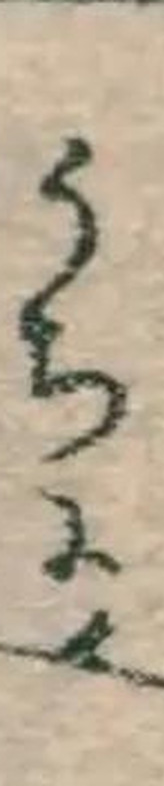うちに
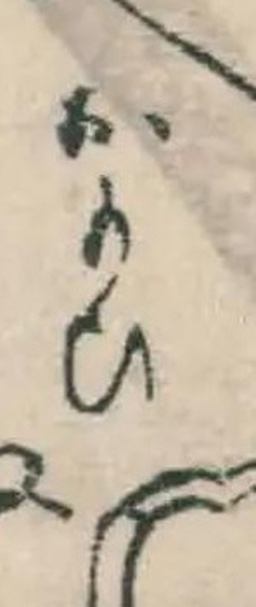おもひぬ

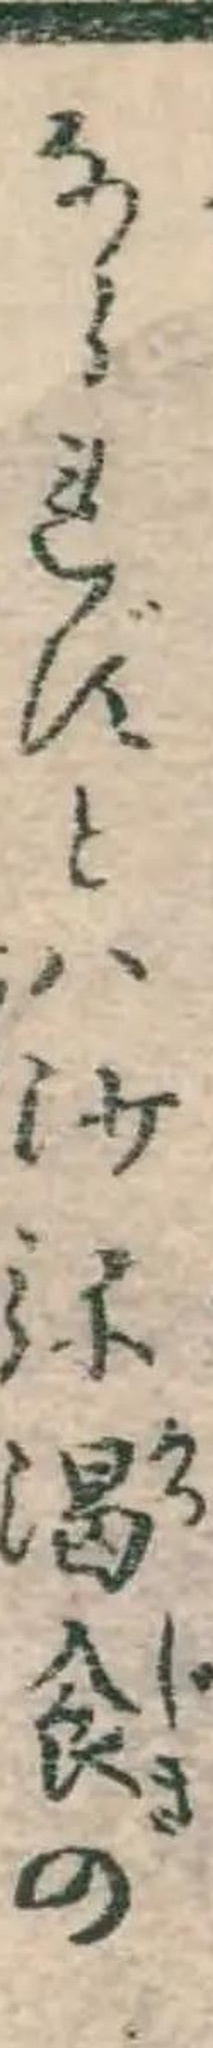なられずとは沙弥渇食の
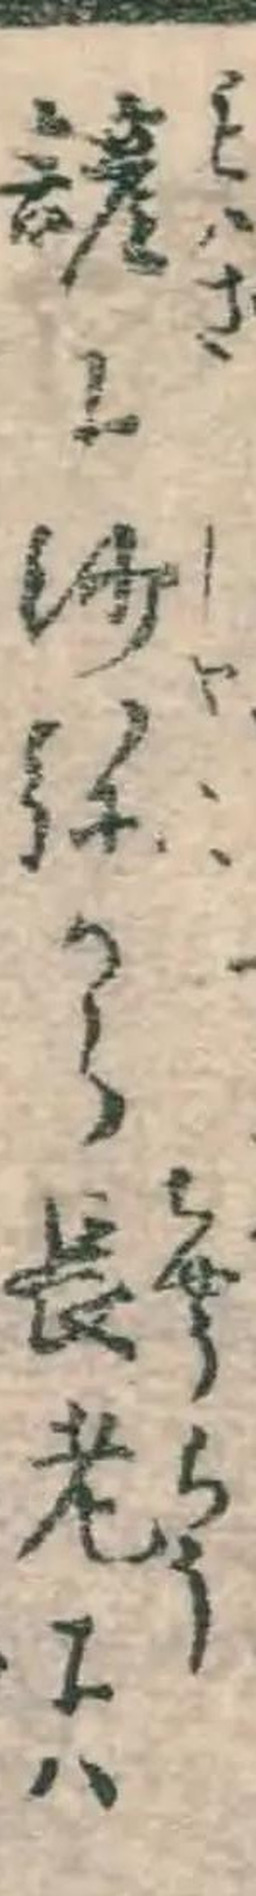諺に沙弥から長老には
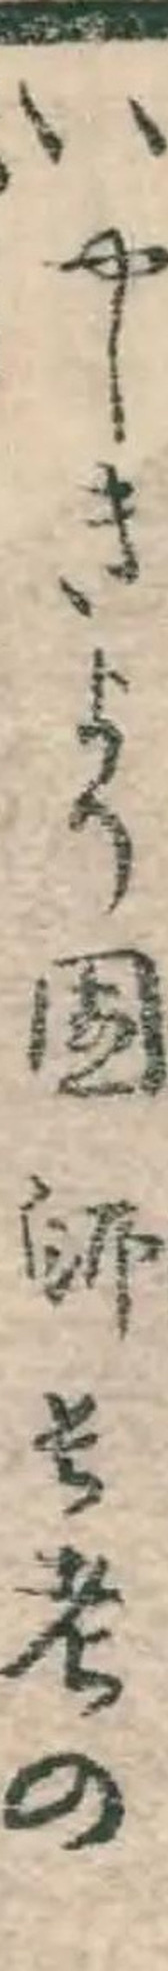いやしきより国師長老の
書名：百鬼徒然袋 3巻. [2]
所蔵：国立国会図書館 National Diet Library, JAPAN
